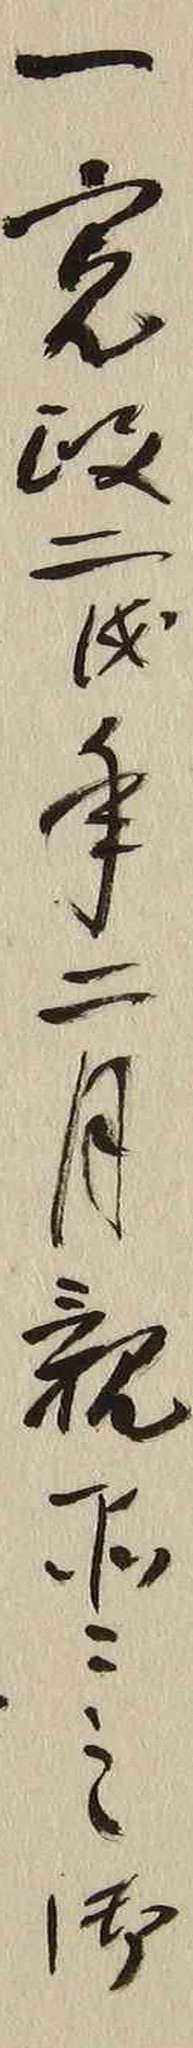一寛政二戌年二月親品々之御
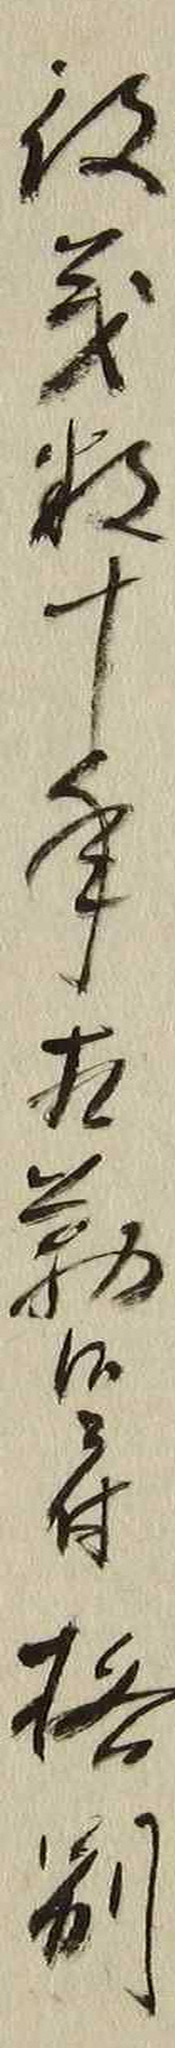役義数十年相勤候ニ付格別
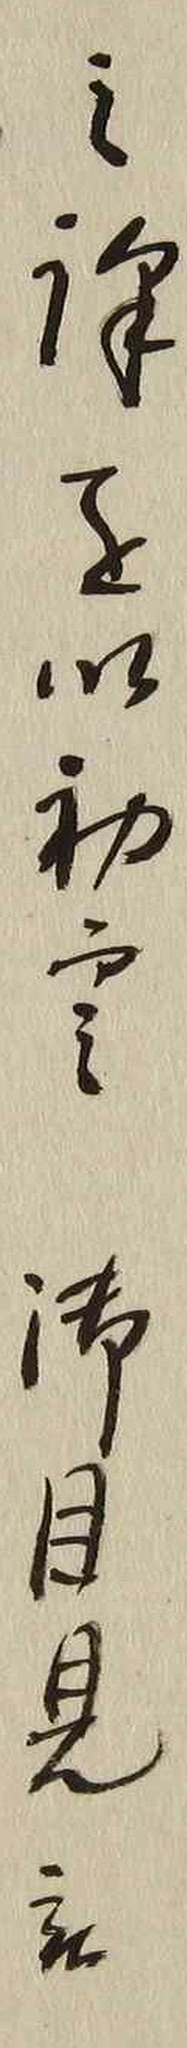之訳を以初而之御目見被
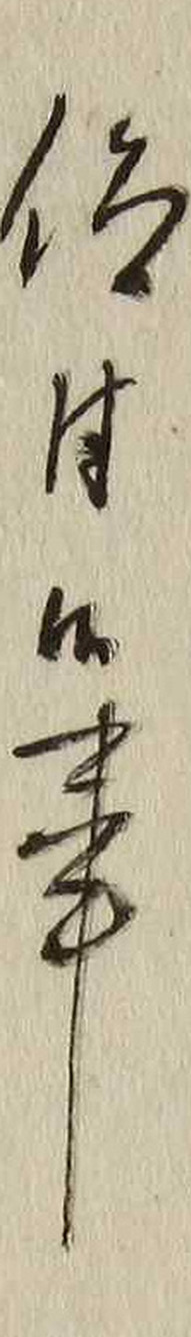仰付候事
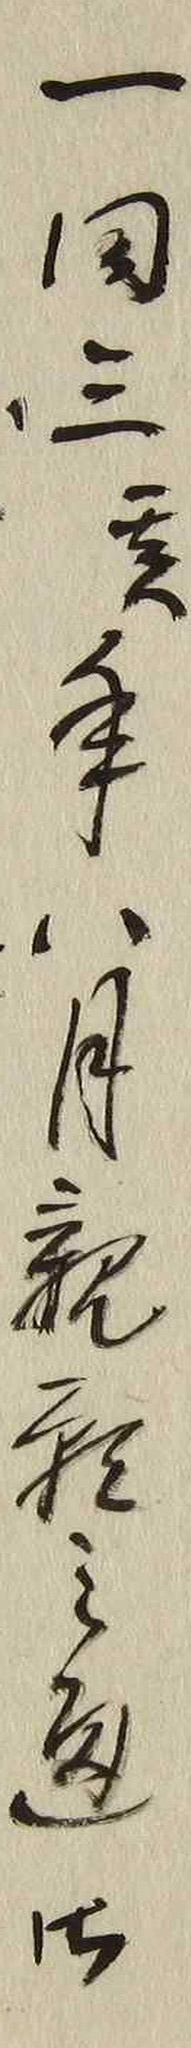一同三亥年八月親願之通御
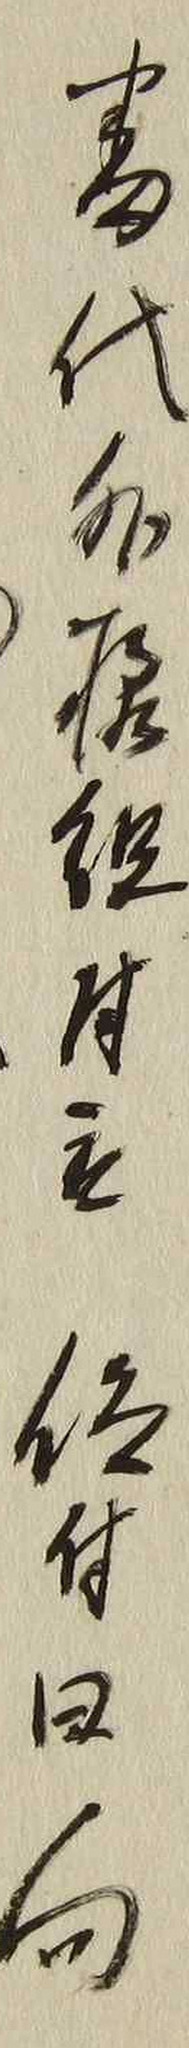番代外様組付被仰付日向
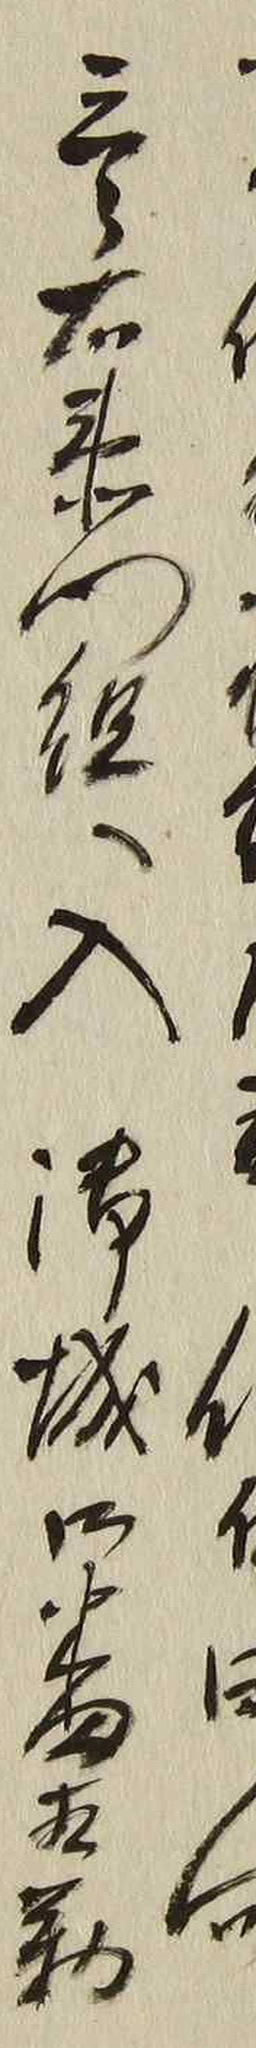三郎右衛門組へ入御城御番相勤
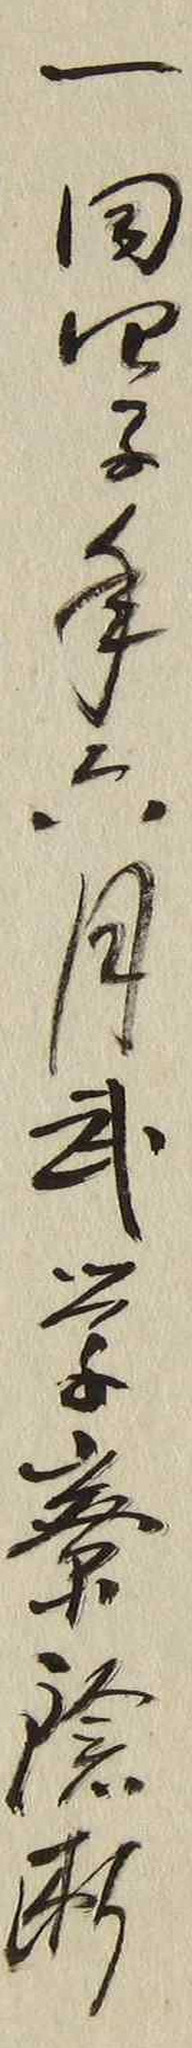一同四子年六月武学寮鎗術
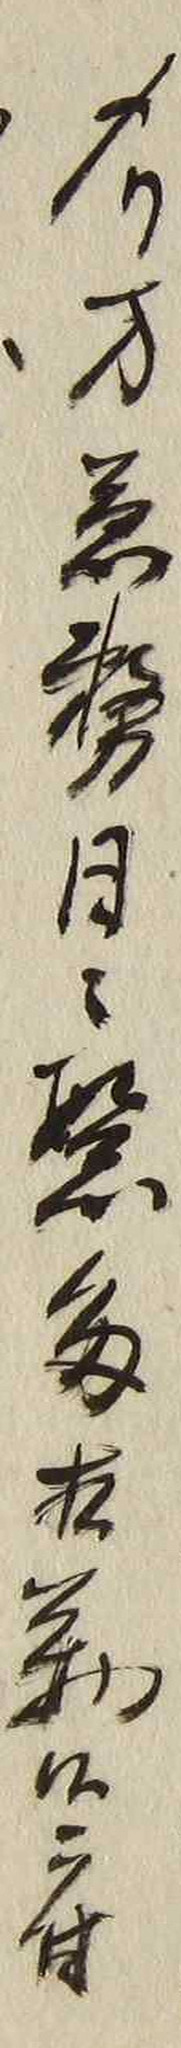〆り方兼務日々繁多相勤候ニ付
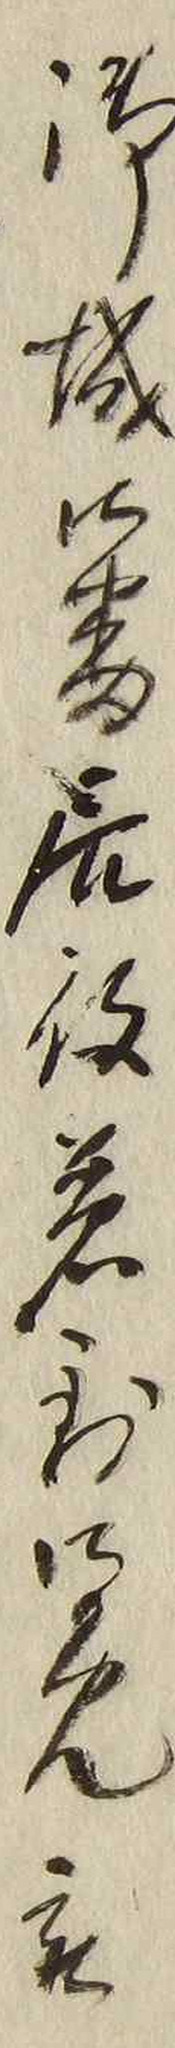御城御番居役着到御免被
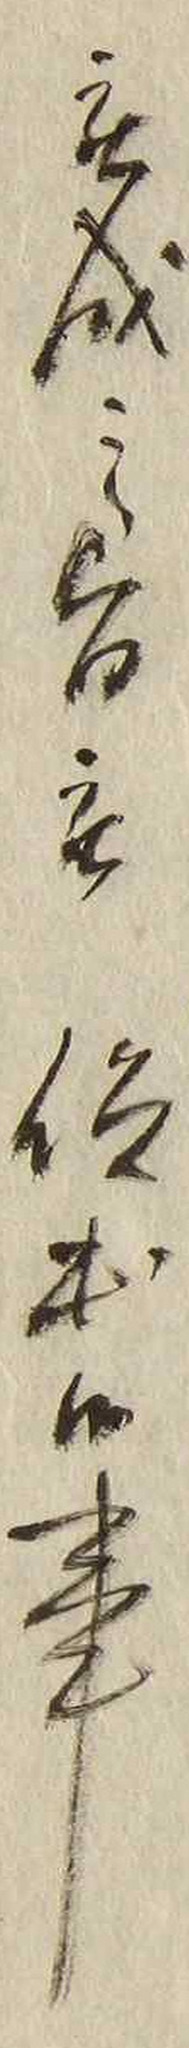被成之之旨被仰出候事

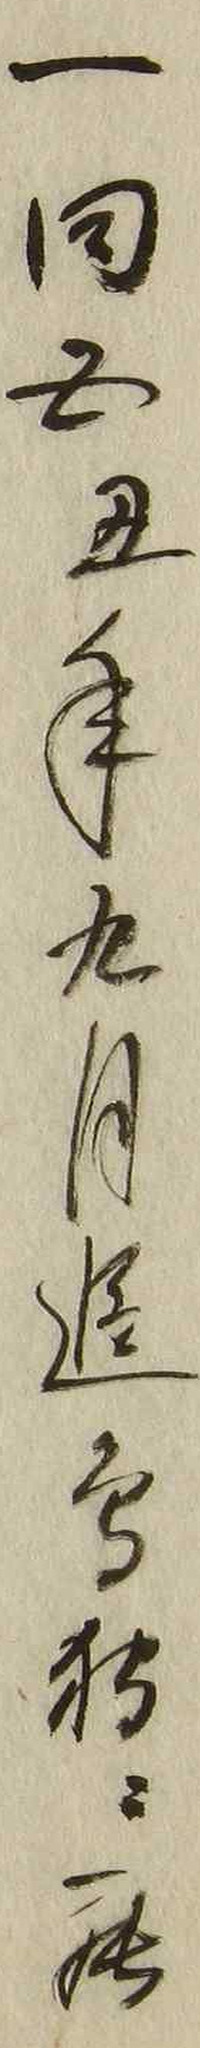一同五丑年九月追鳥狩ニ罷
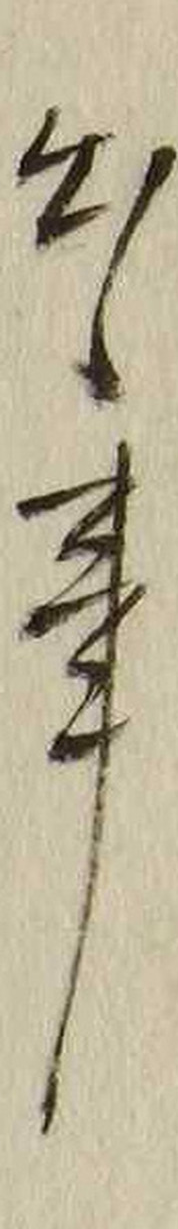出候事
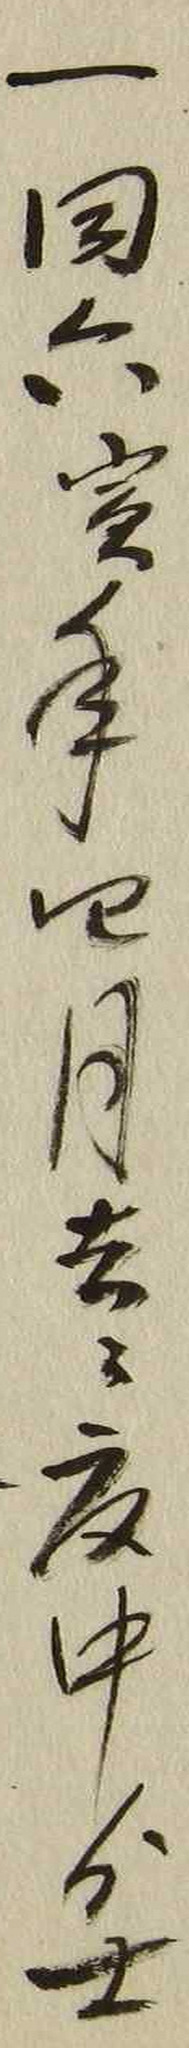一同六寅年四月去々夏中ゟ士
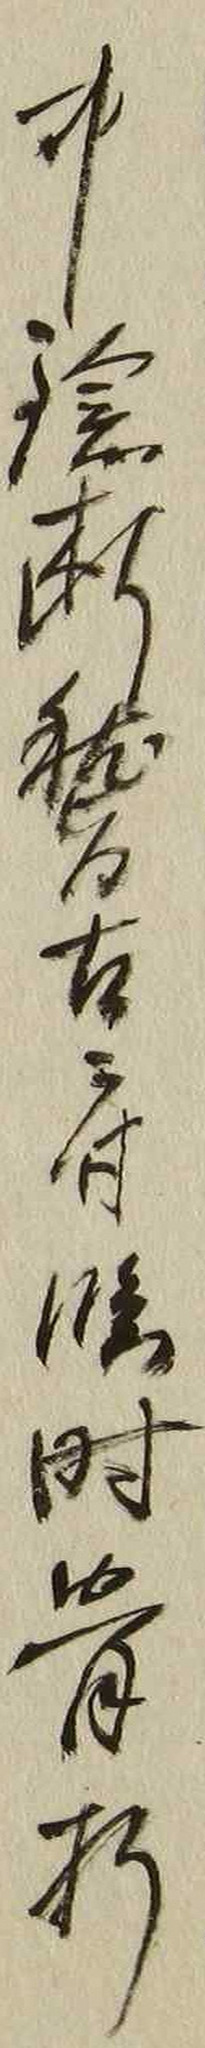中鎗術稽古ニ付臨時骨折
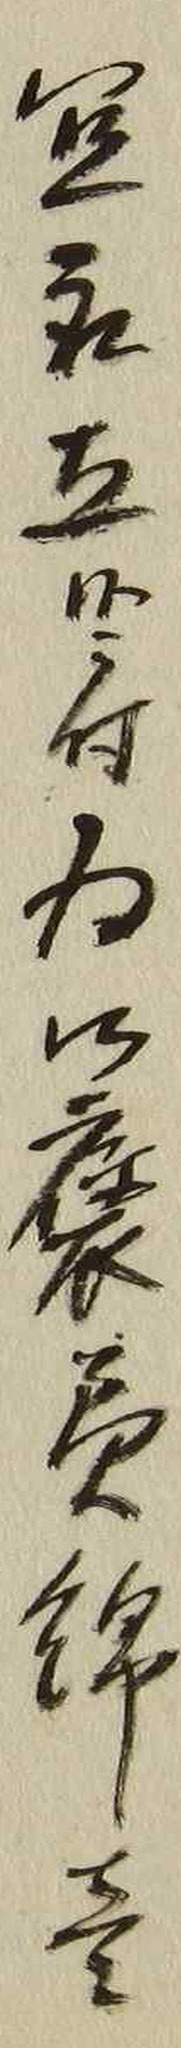宜取立候ニ付為御褒美綿壱
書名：諸士系譜　巻之359　す之部9
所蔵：会津若松市立会津図書館
